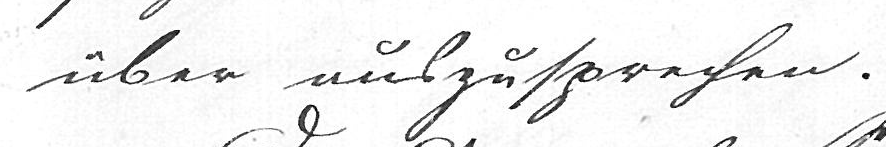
über auszusprechen.
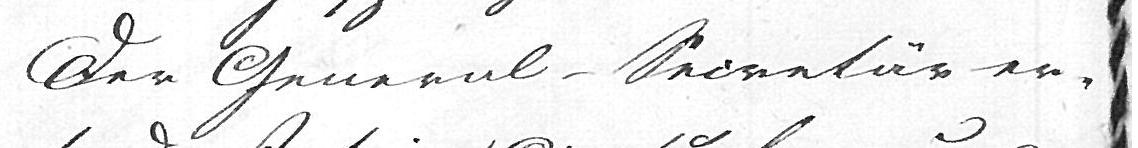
Der General-Secretär er-
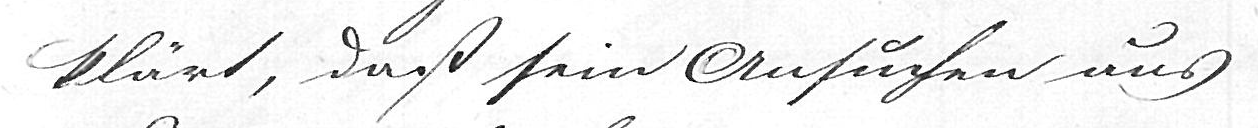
klärt, daß sein Ansuchen aus
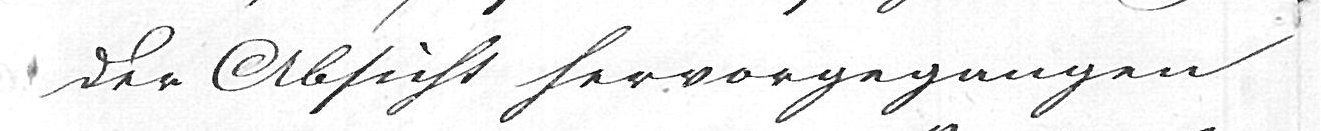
der Absicht hervorgegangen
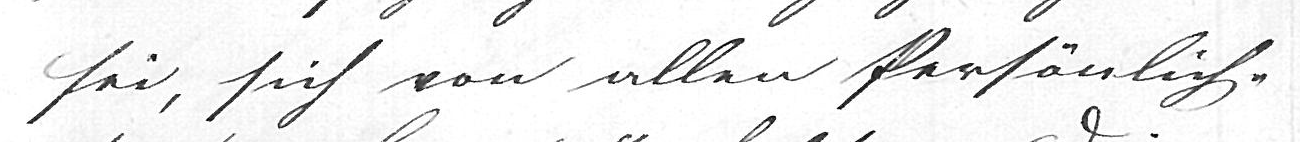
sei, sich von allen Persönlich-
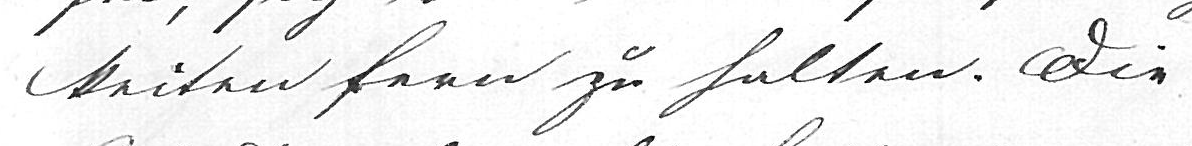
keiten fern zu halten. Die
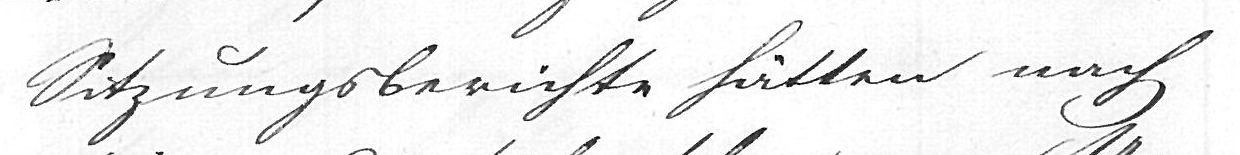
Sitzungsberichte hätten nach
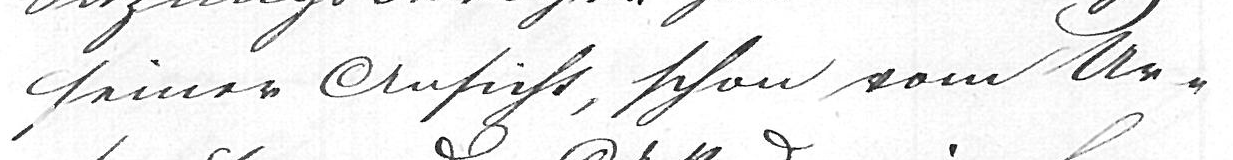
seiner Ansicht, schon vom Ur-
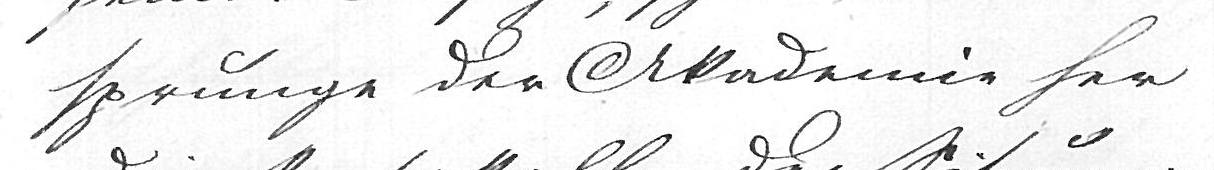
sprunge der Akademie her
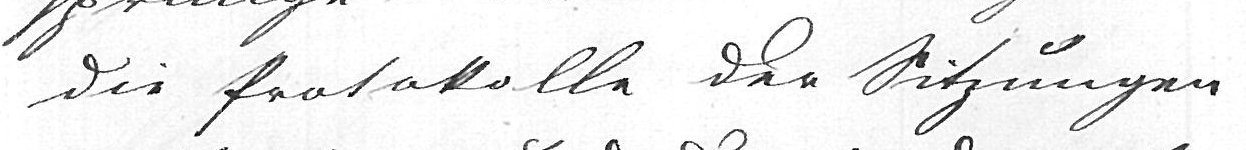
die Protokolle der Sitzungen
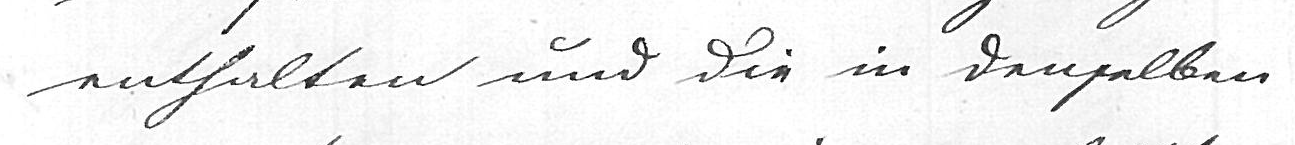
enthalten und die in denselben
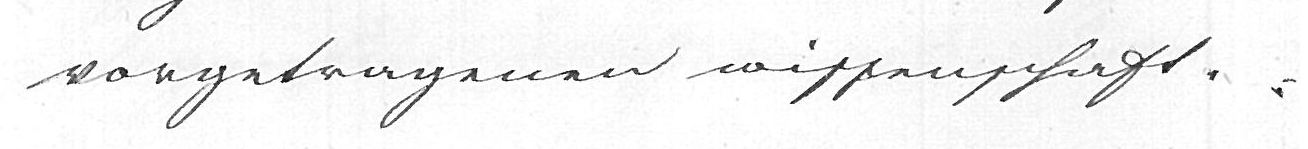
vorgetragenen wissenschaft-
